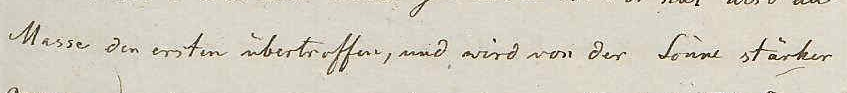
Masse den ersten übertroffen, und wird von der Sonne stärker
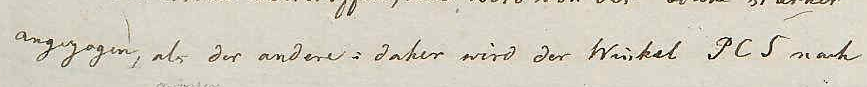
angezogen, als der andere: daher wird der Winkel PCS nach
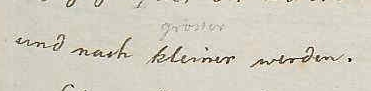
und nach kleiner grösser werden.
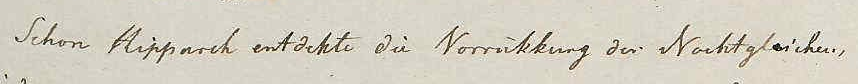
Schon Hipparch entdekte die Vorrükung der Nachtgleichen,
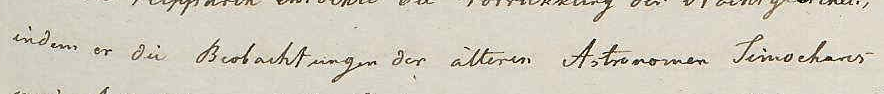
indem er die Beobachtungen der älteren Astronomen Timocharis
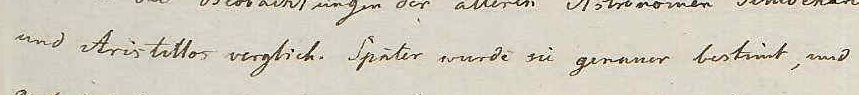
und Aristillos verglich. Später wurde sie genauer bestimt, und
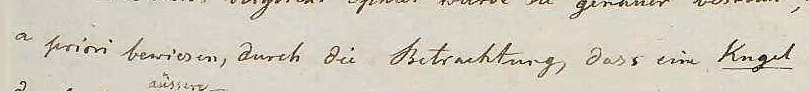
a priori bewiesen, durch die Betrachtung, dass eine Kugel
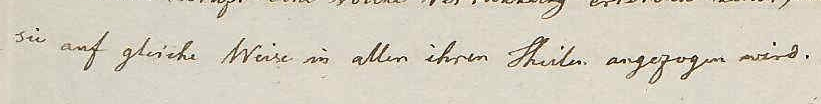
sie auf gleiche Weise in allen ihren Theilen angezogen wird. –
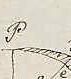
eine
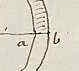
derselben
